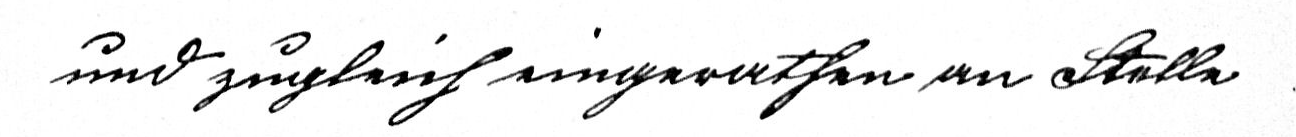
und zugleich eingerathen an Stelle
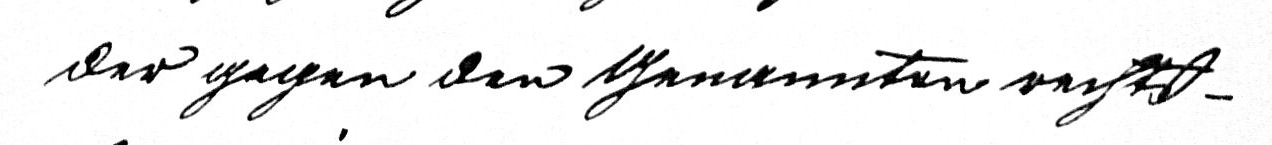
der gegen den Genannten rechts¬
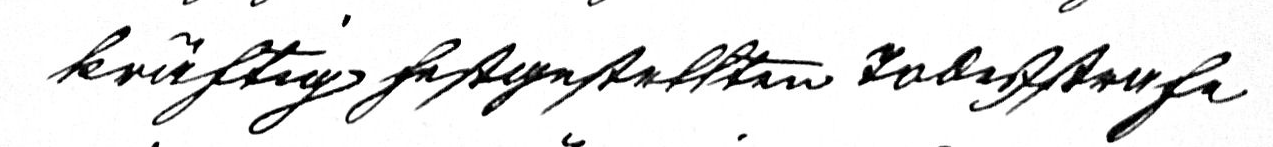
kräftig festgestellten Todestrafe
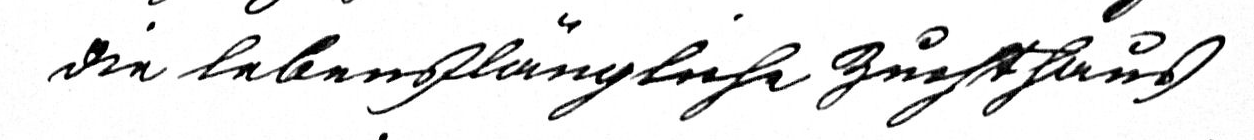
die lebenslängliche Zucht haus
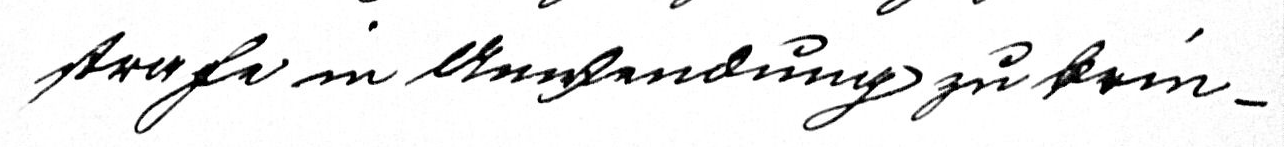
strafe in Anwendung zu brin¬
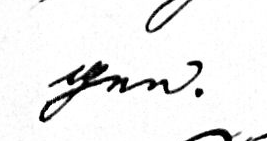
gen.
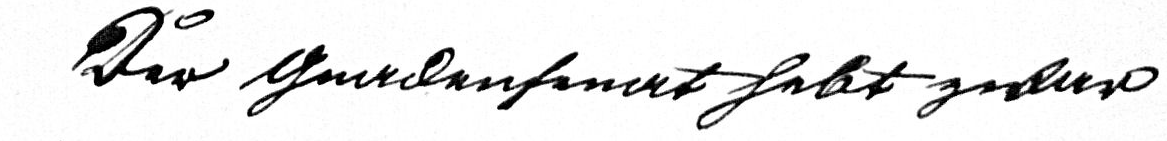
Der Gnadensenat hebt zwar
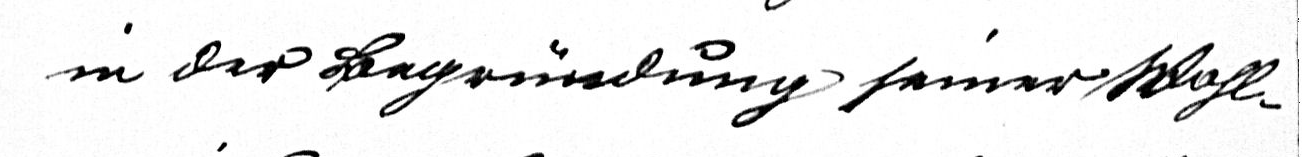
in der Begründung seiner Wohl¬
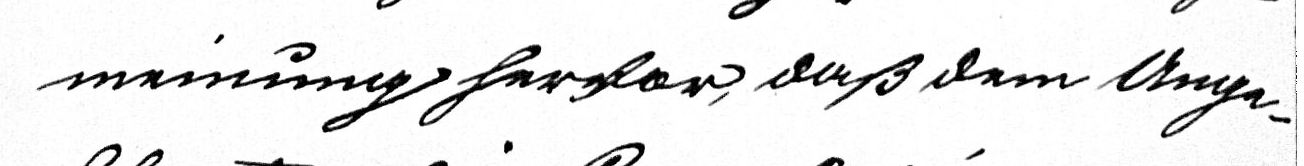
meinung hervor, daß dem Ange¬
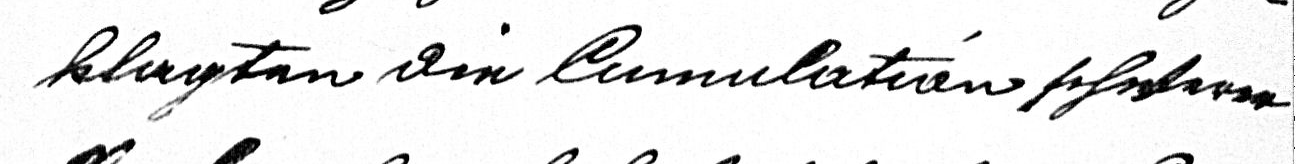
klagten die Cumulation schwerer
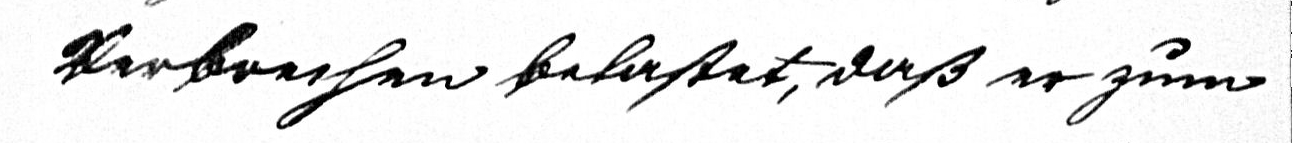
Verbrechen betastet, daß er zum
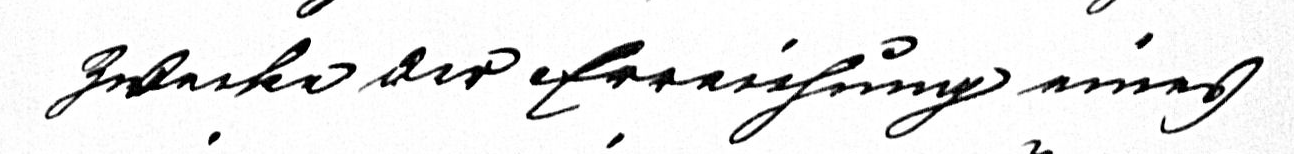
Zwecke der Erreichung eines
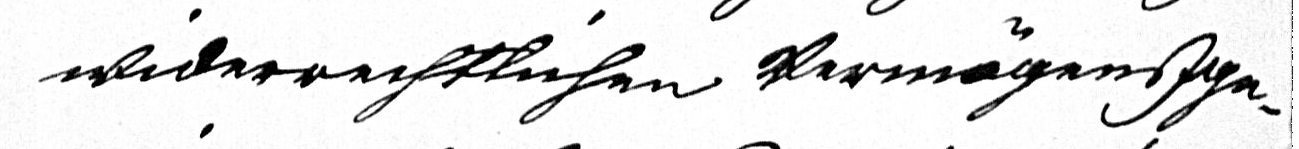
widerrechtlichen Vermögensge¬
